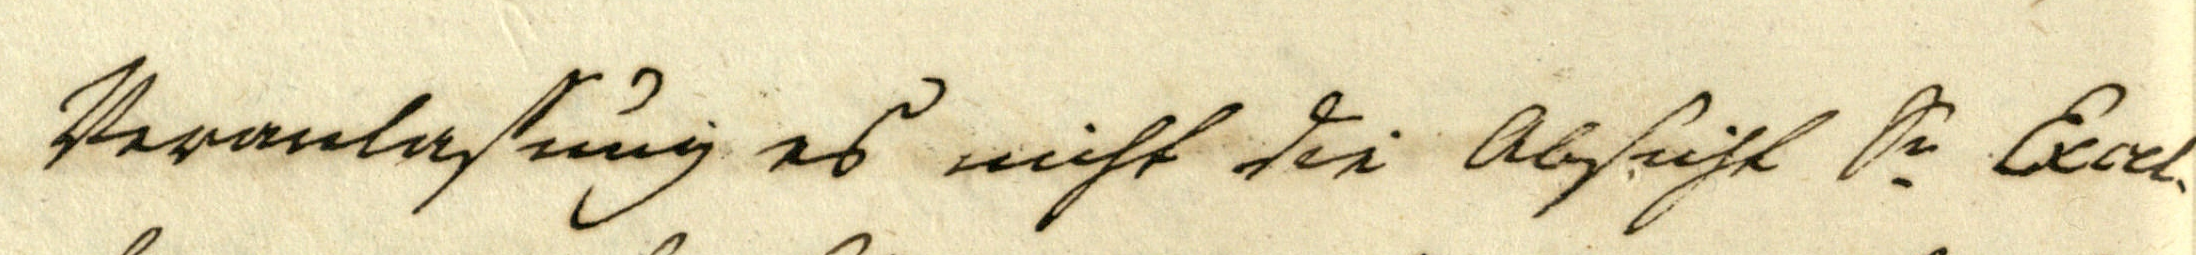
Veranlassung es nicht die Absicht Sr Exce¬
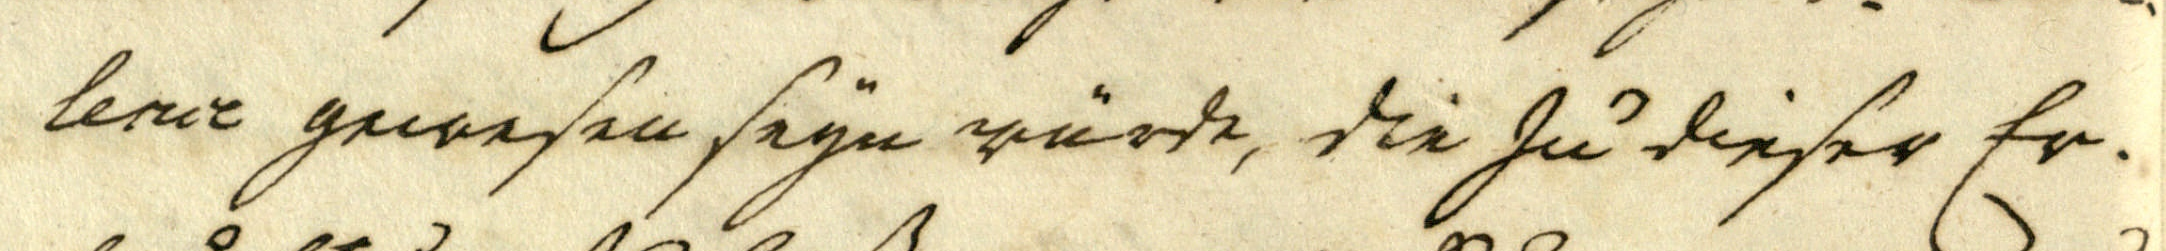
lence gewesen seÿn würde, die zu dieser Er¬
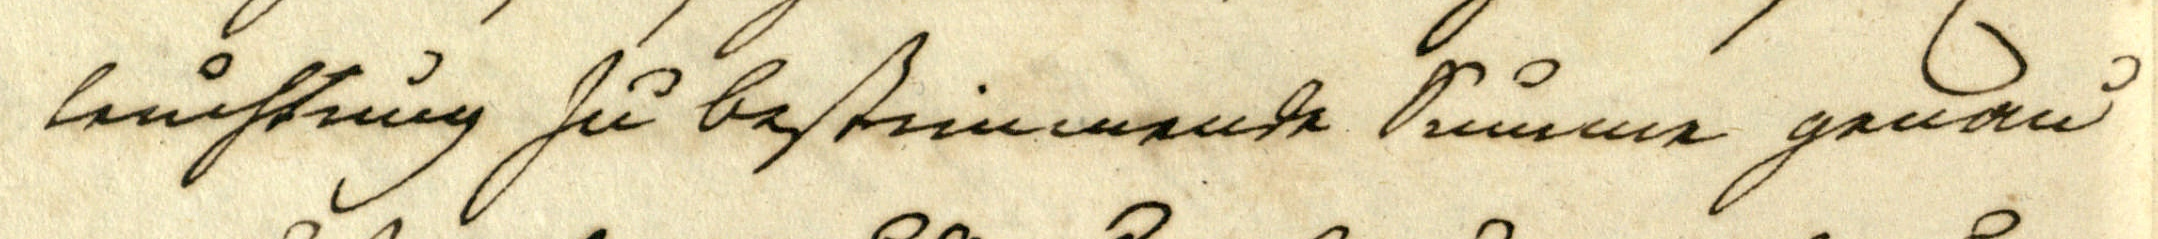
leuchtung zu bestimmende Summe genau
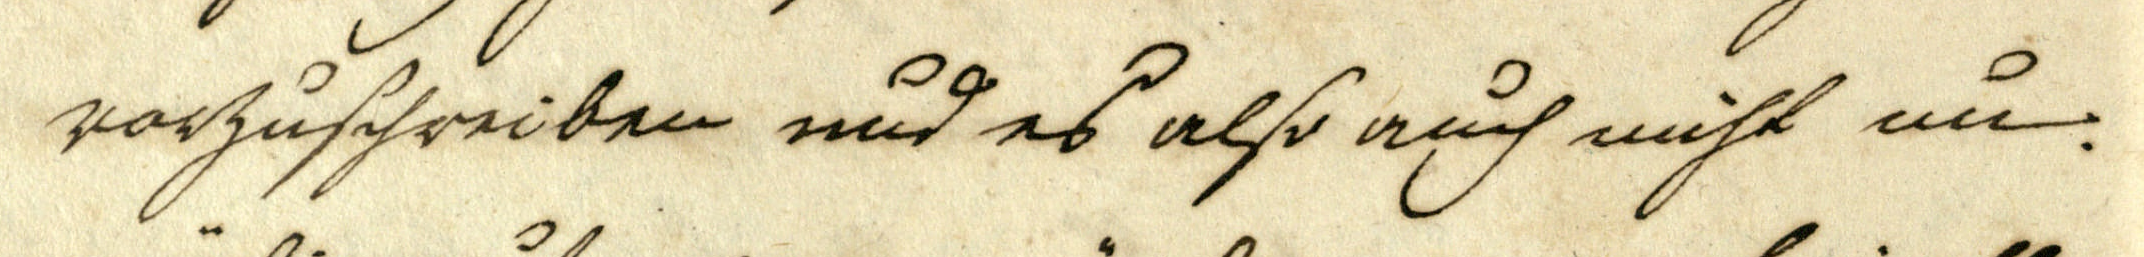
vorzuschreiben und es also auch nicht un¬
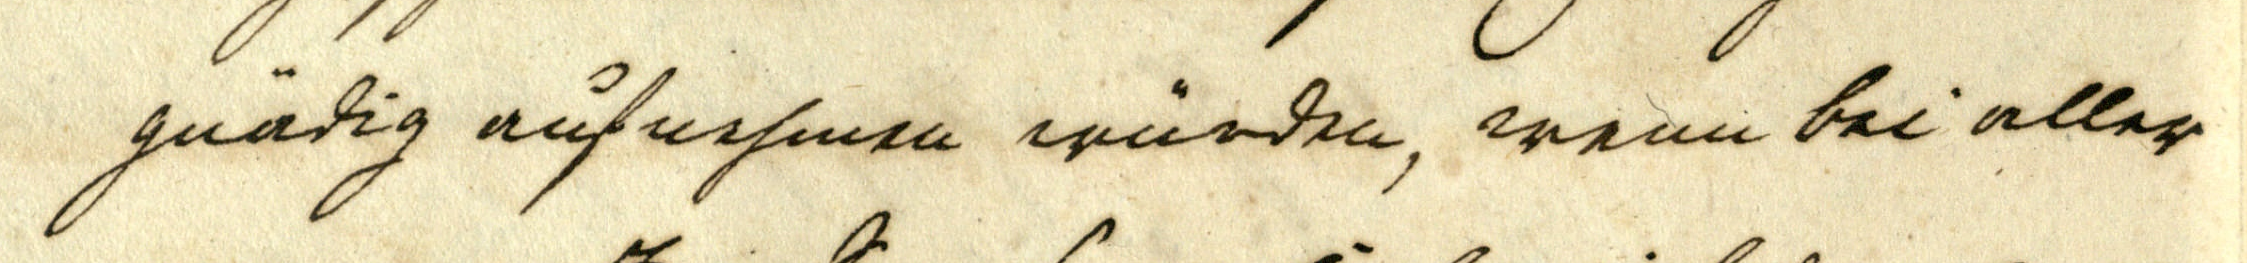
gnädig aufnehmen würden, wenn bei aller
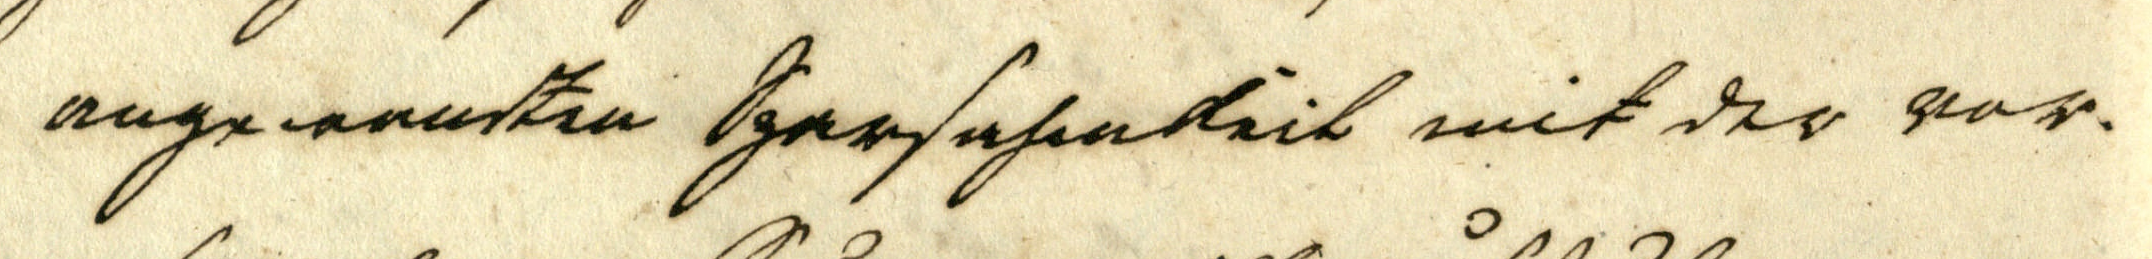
angewandten Sparsahmkeit mit der vor¬
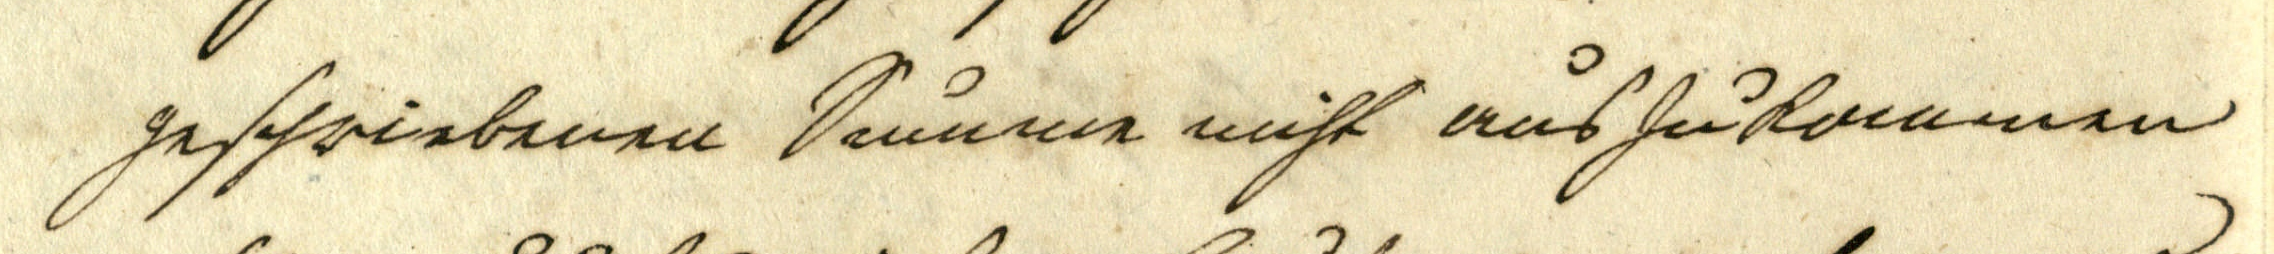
geschriebenen Summe nicht aus zukommen
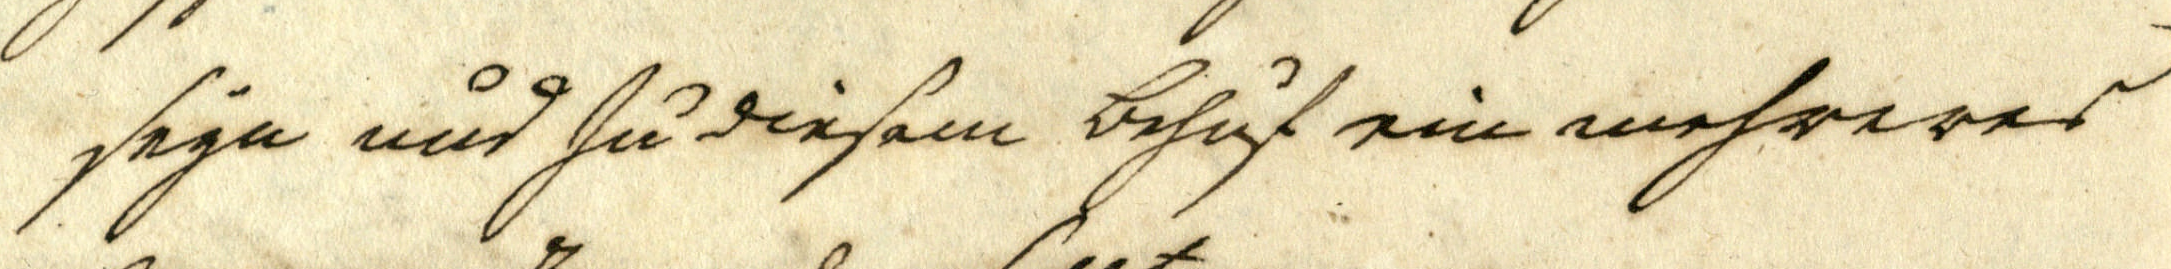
seÿn und zu diesem Behuf ein mehreres
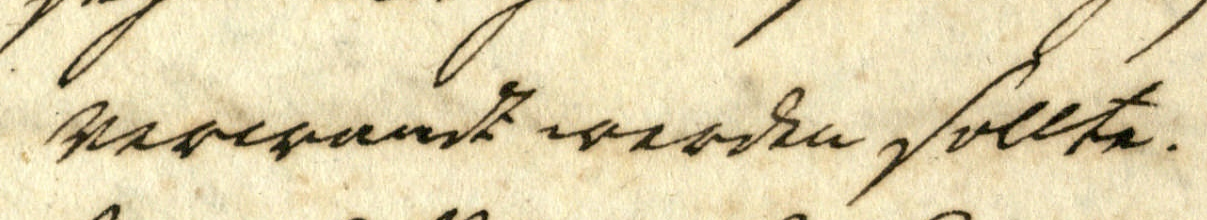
verwandt werden sollte.
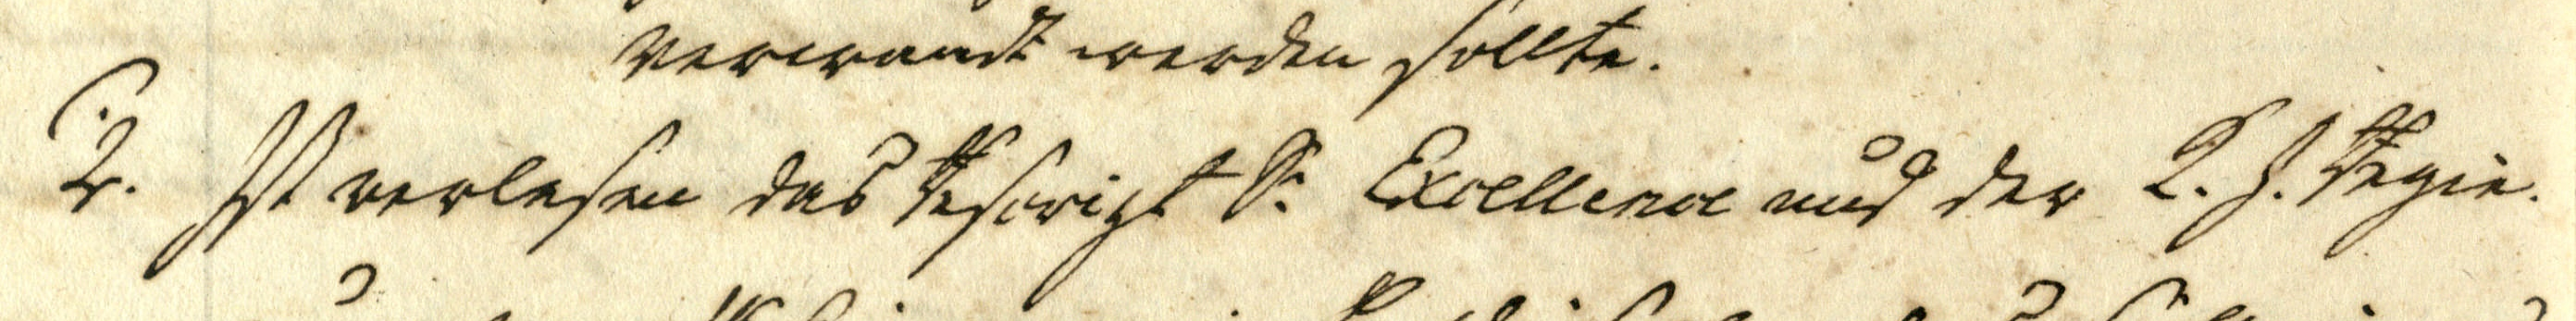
2. Ist verlesen das Rescript Sr Excellence und der K. H. Regie¬
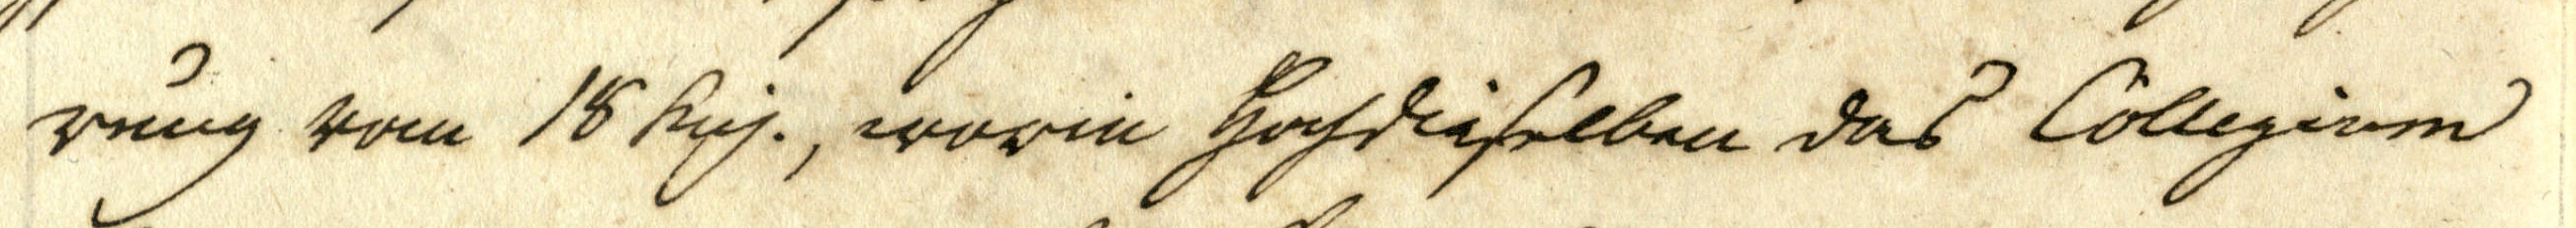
rung vom 18 huj., worin Hochdieselben das Collegium
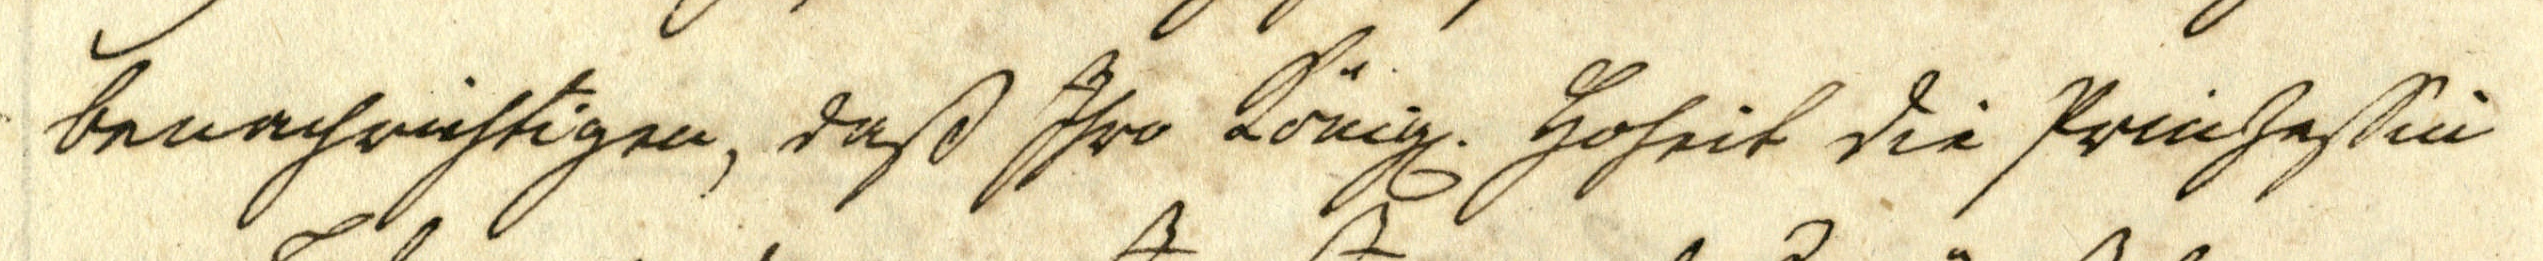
benachrichtigen, daß Ihro Königl. Hoheit die Prinzessin
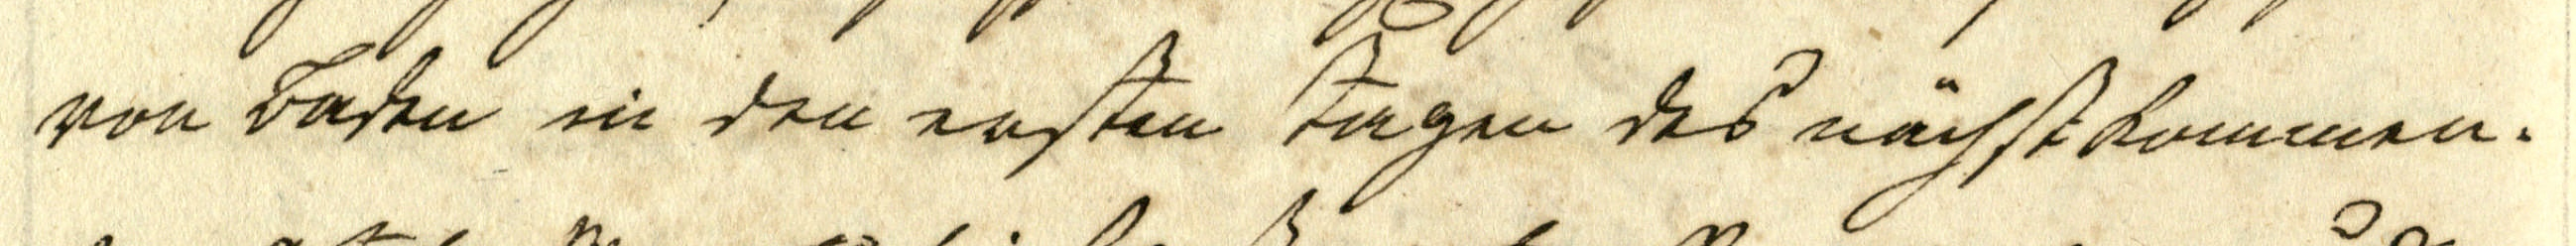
von Baden in den ersten Tagen des nächstkommen¬
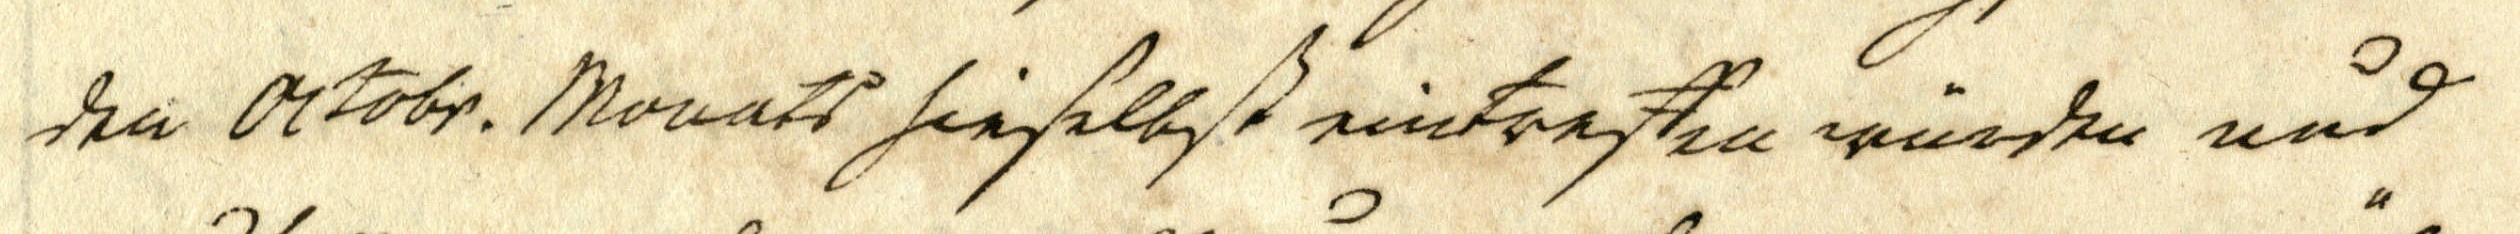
den Octobr. Monats hieselbst eintreffen würden und
